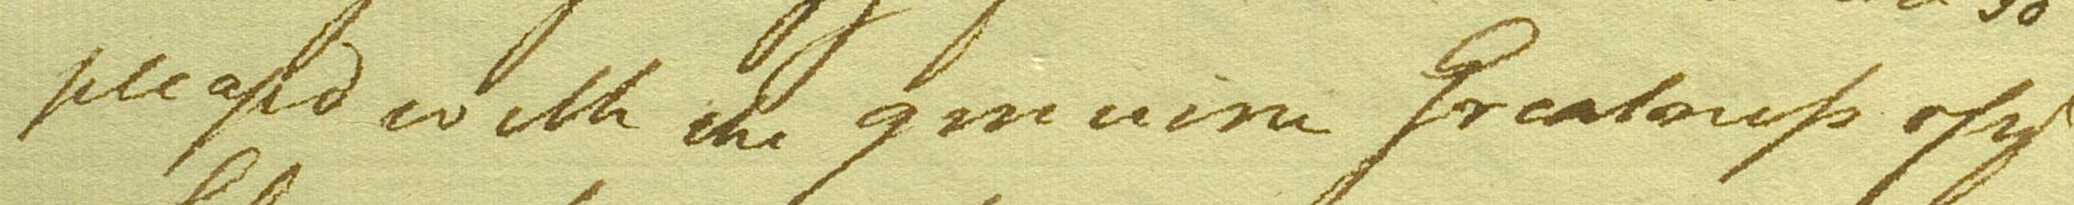pleas'd with the genuine Greatness of y^e
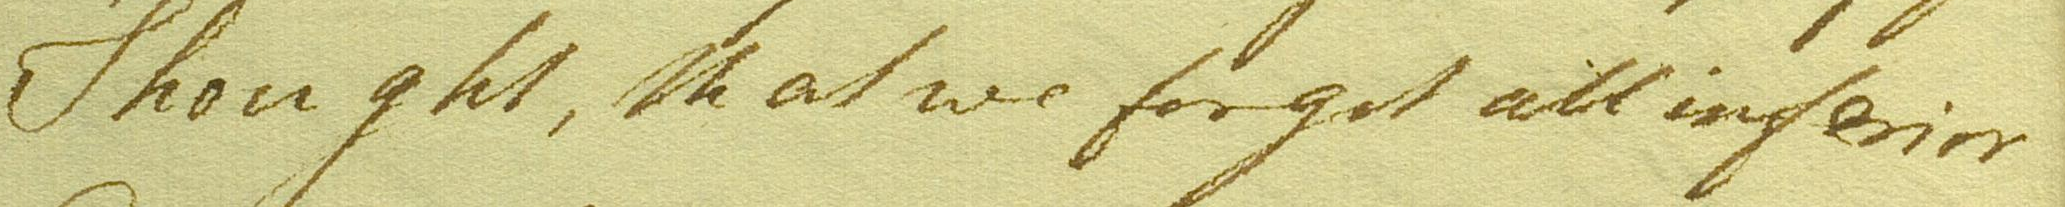Thought, that we forget all inferior
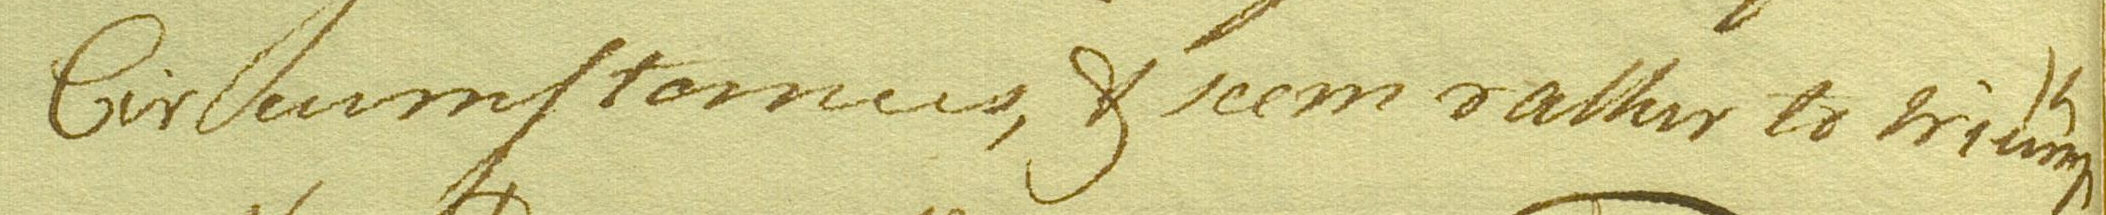Circumstances, & seem rather to triump^h
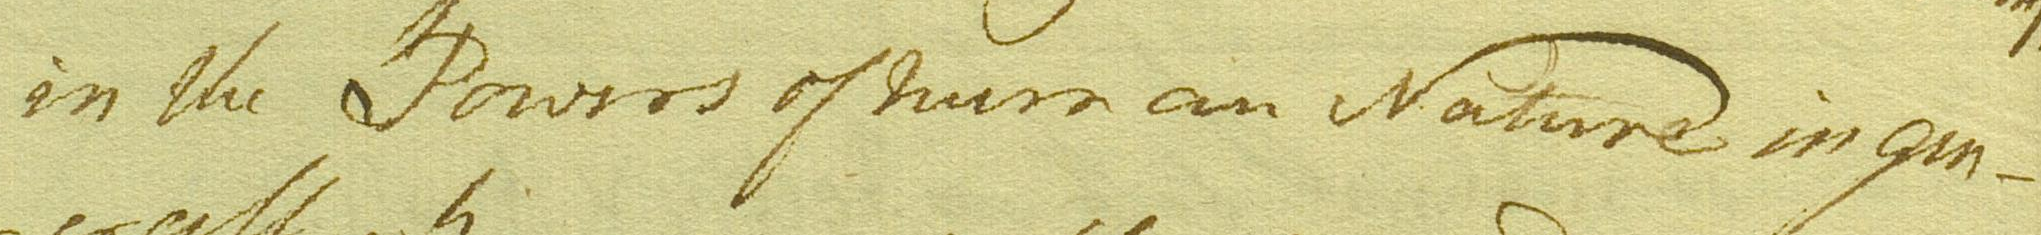in the Power of human Nature in gen-
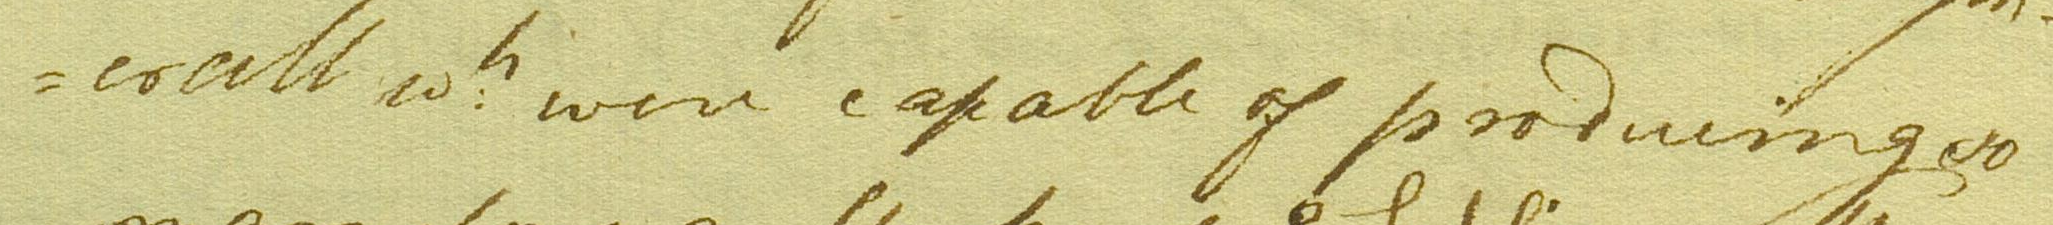-erall w^h were capable of producing so
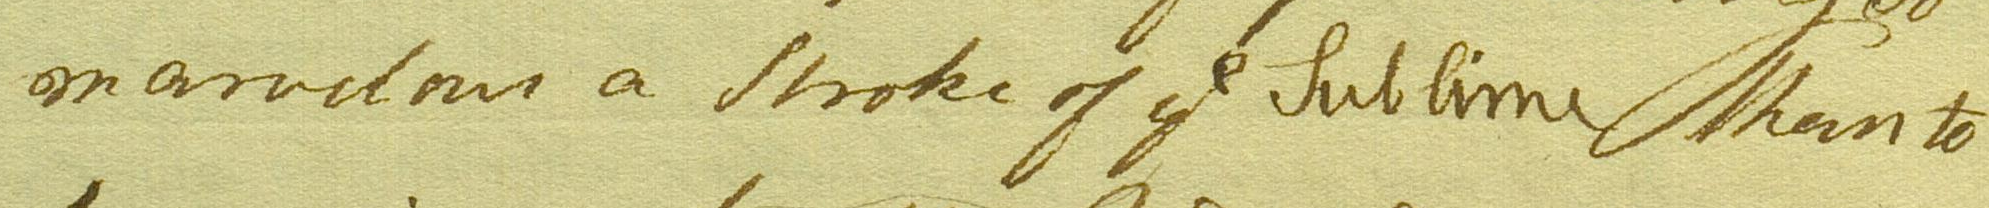marvelous a Stroke of y^e Sublime than to
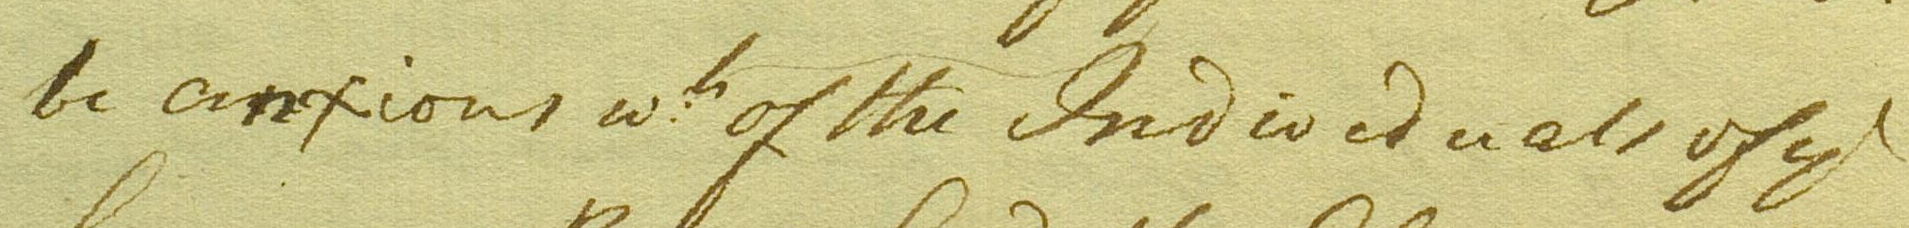be anxious w^h of the Individuals all of y^e
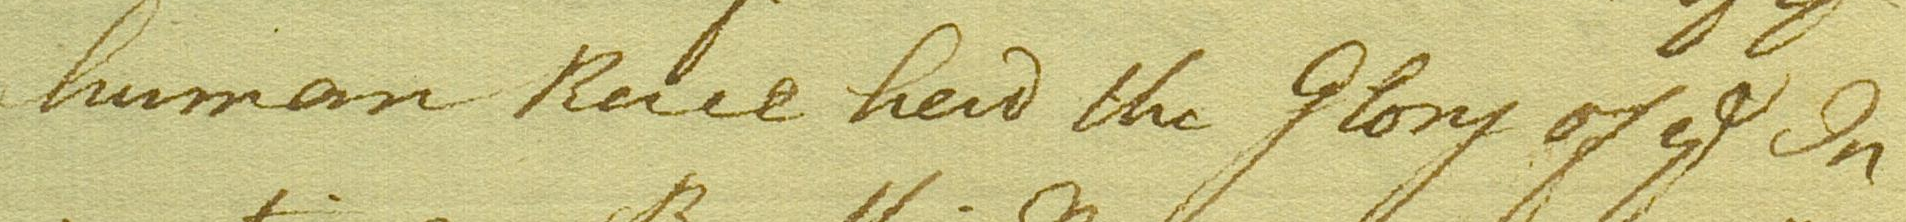human Race had the Glory of y^e In
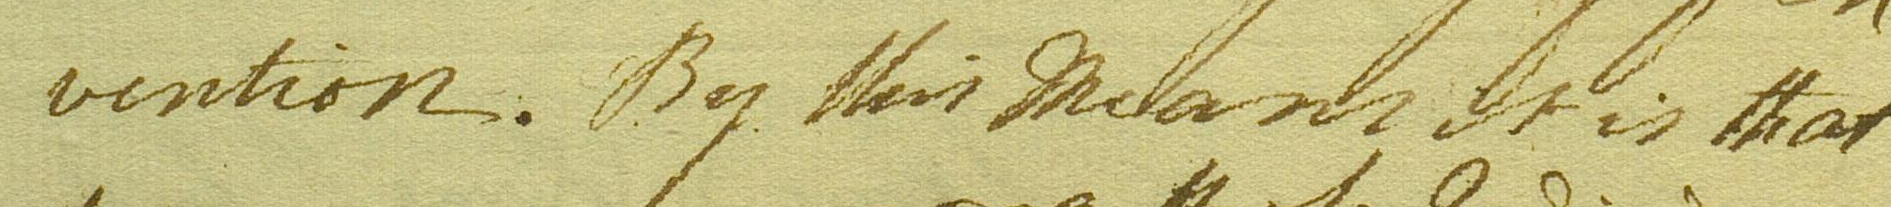vention. By their Means it is that
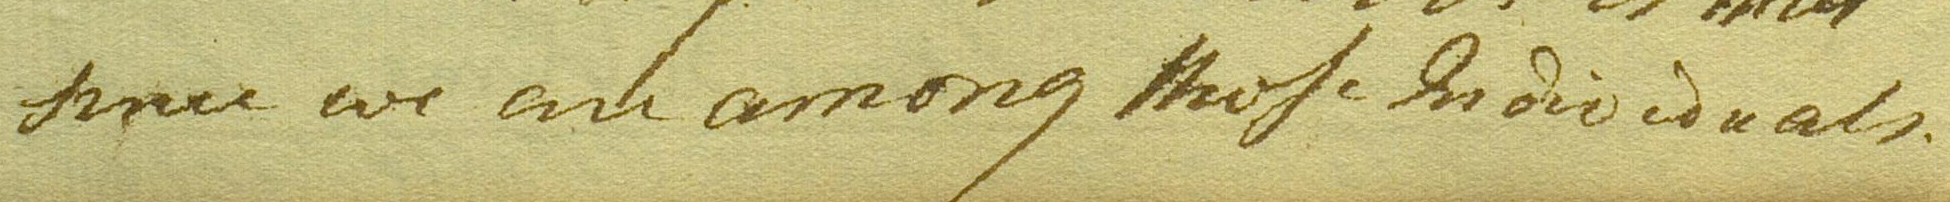since we are among those Individuals.
